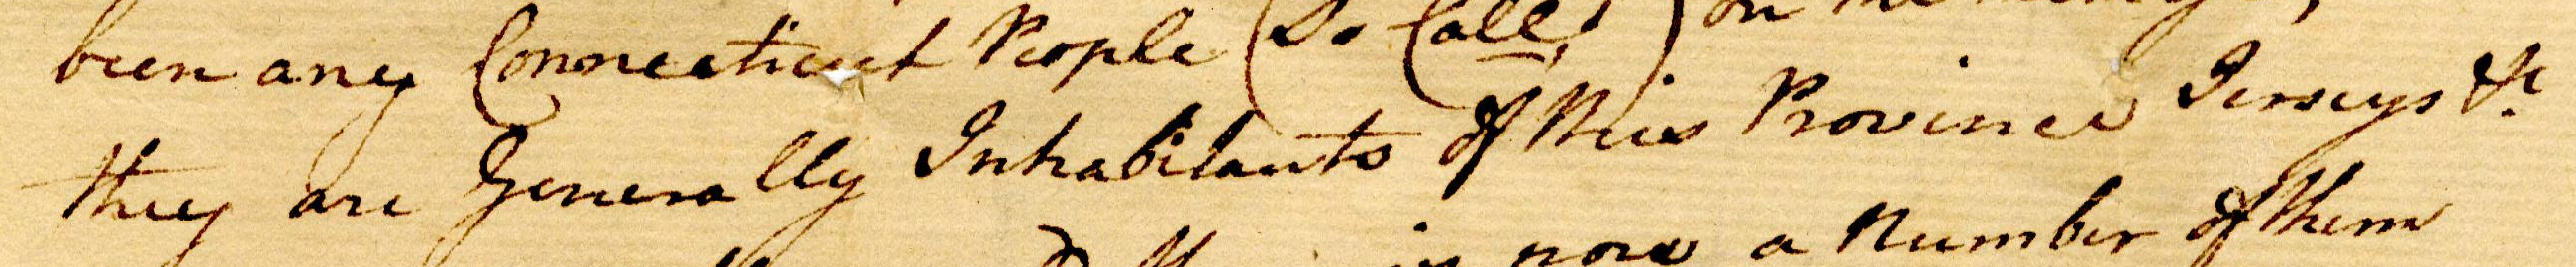they are generally Inhabitants of this Province Jersey &^c.
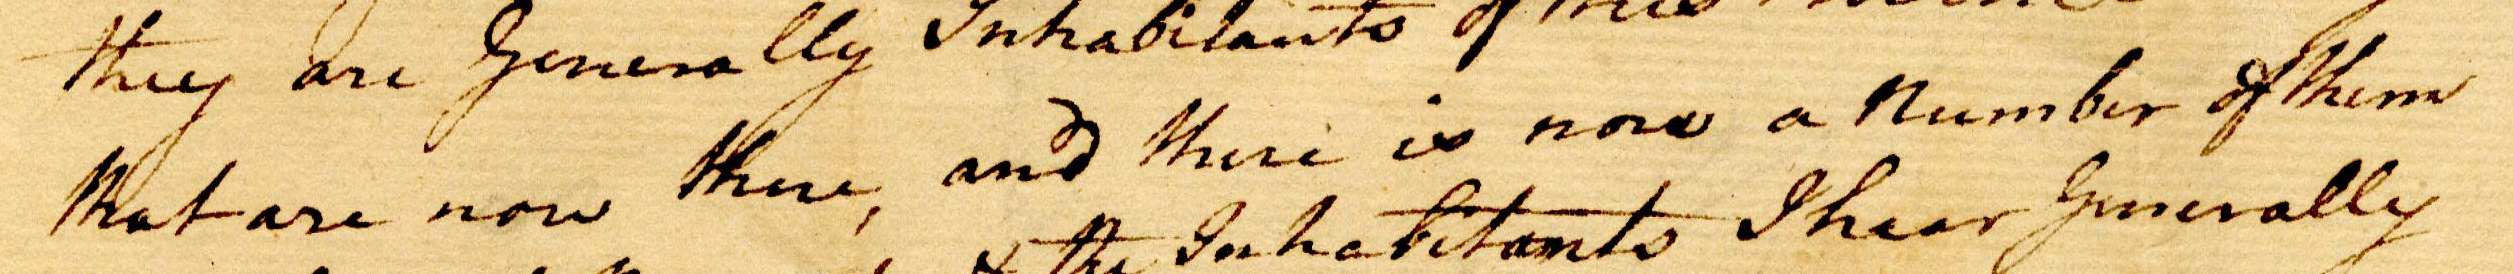that are now there, and there is now a Number of them
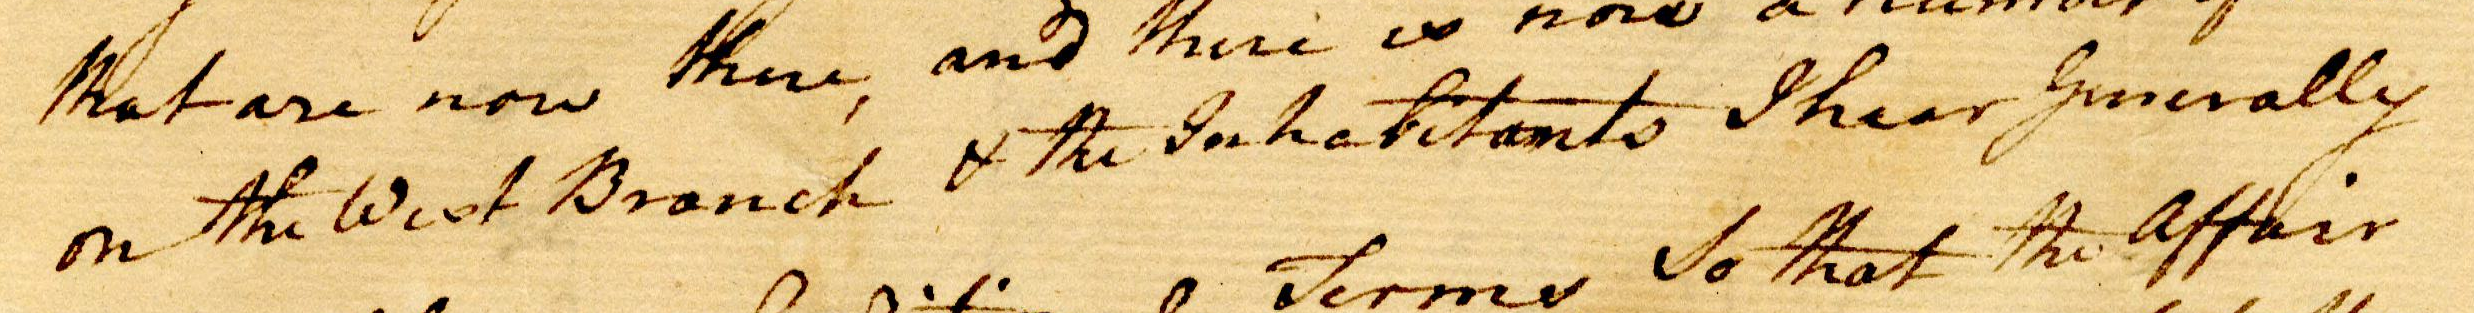on the West Branch & the Inhabitants I hear Generally
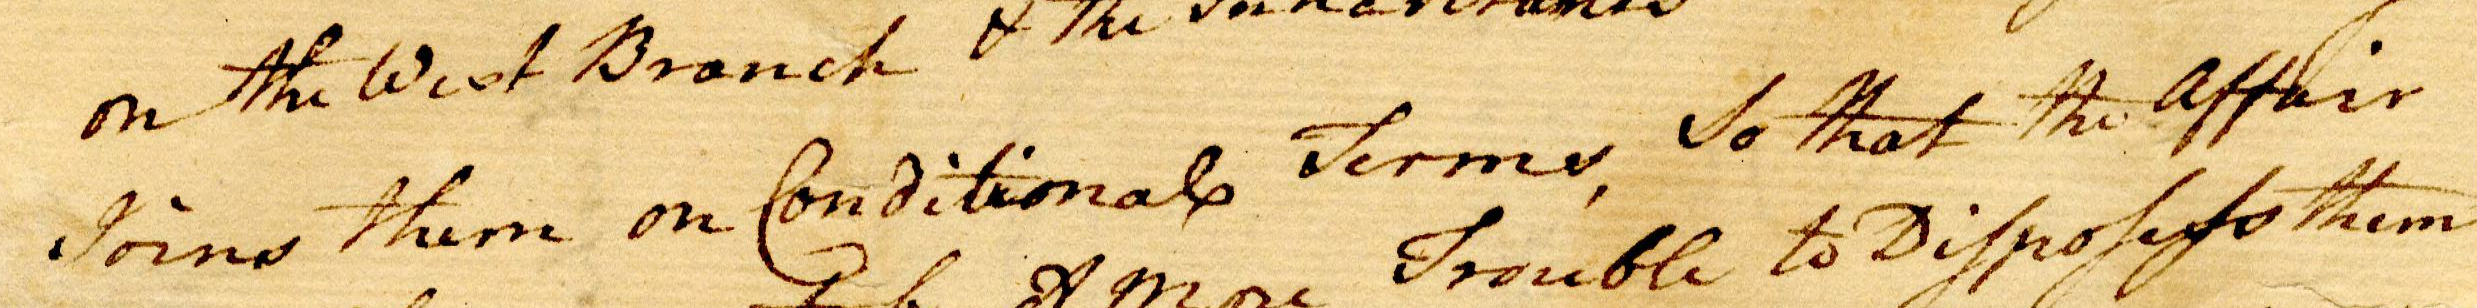Joins them on Conditional Terms, so that the Affair
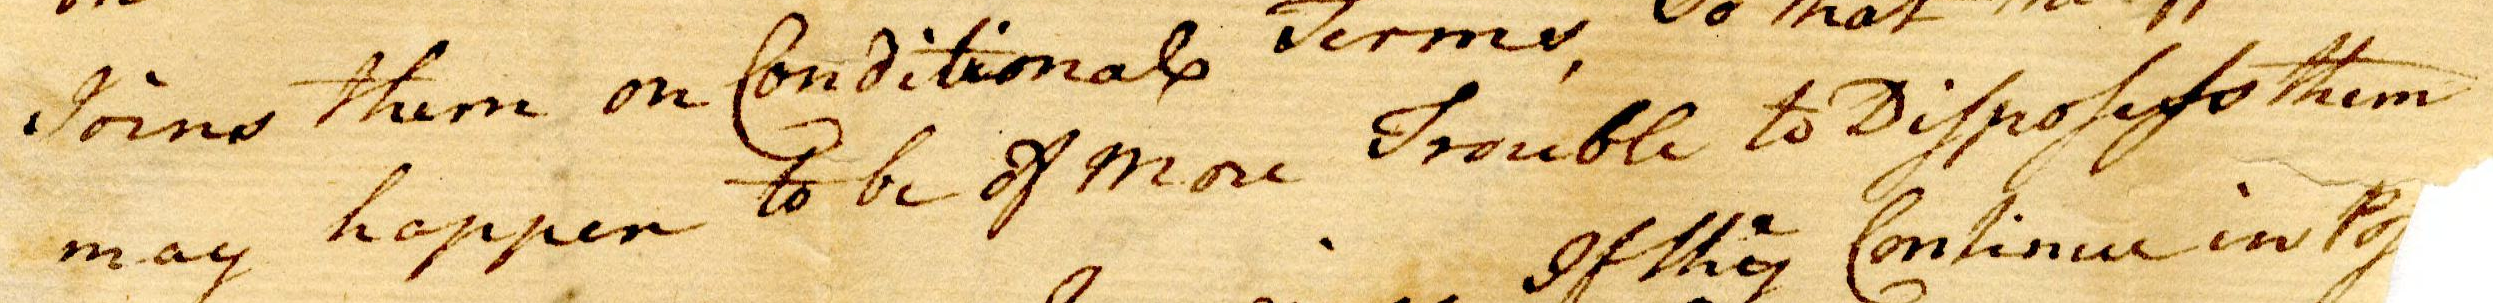may happen to be of more Trouble to Disposess them
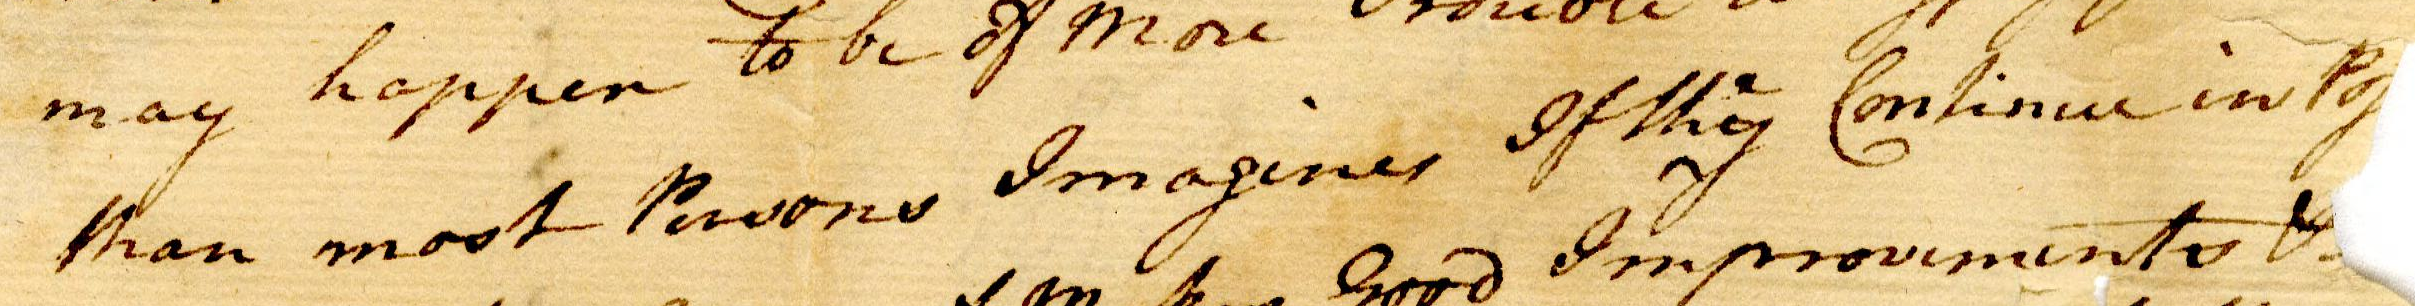than most Persons Imagines If they Continue in Pos
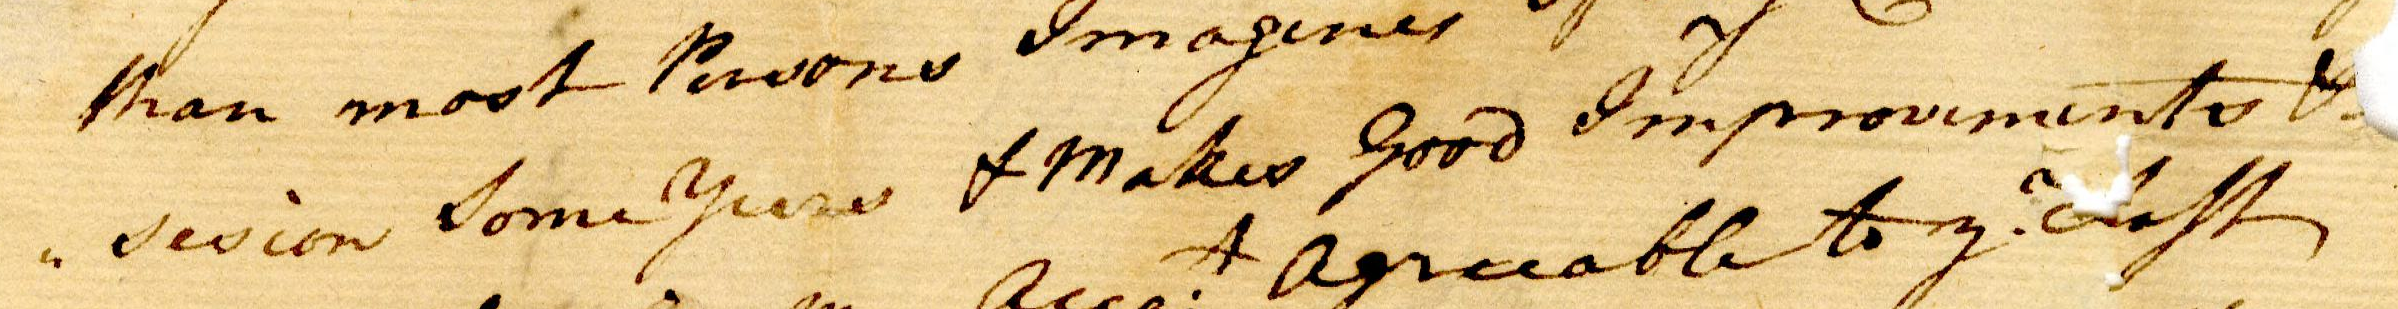-sesion some years & makes good Improvements &
